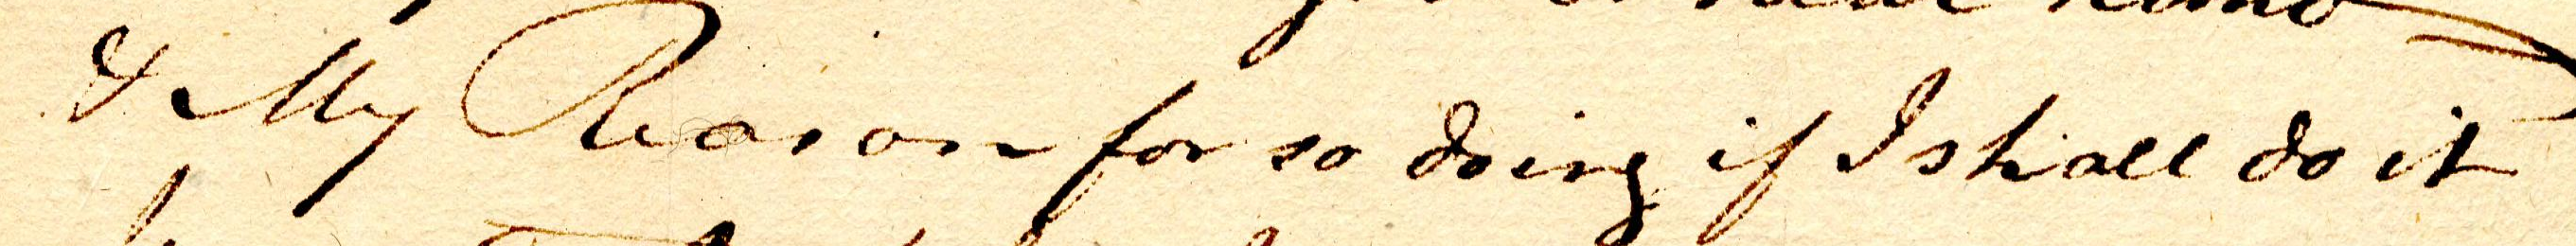& My Reason for so doing if I shall do it
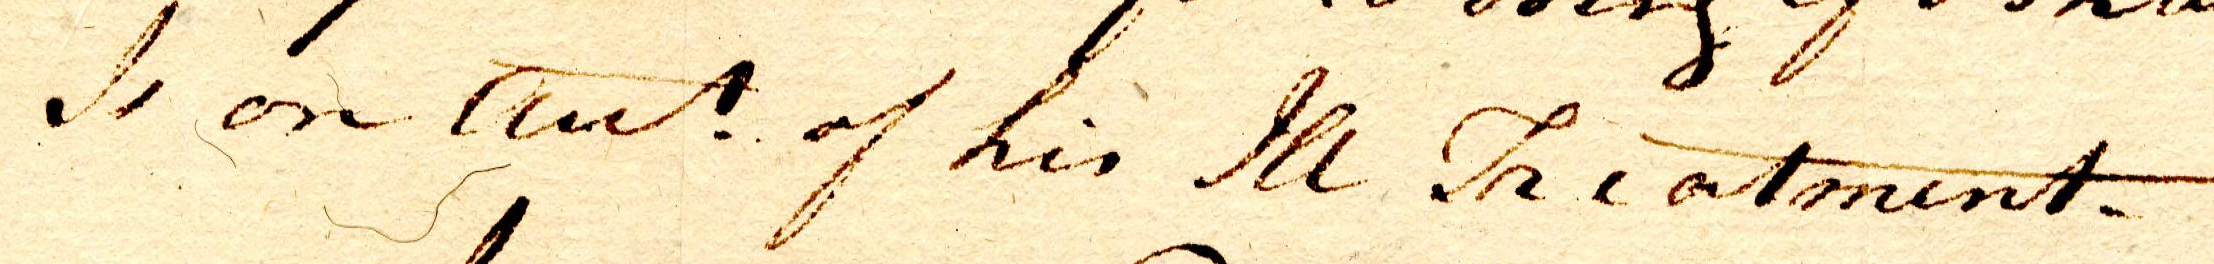Is on Acc^t. of his Ill Treatment.
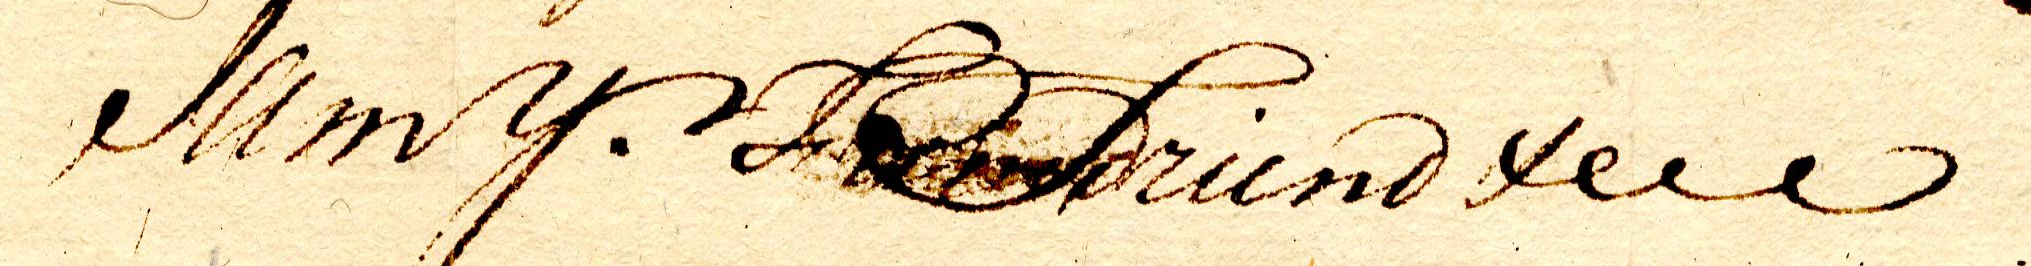I am y^r Friend &c
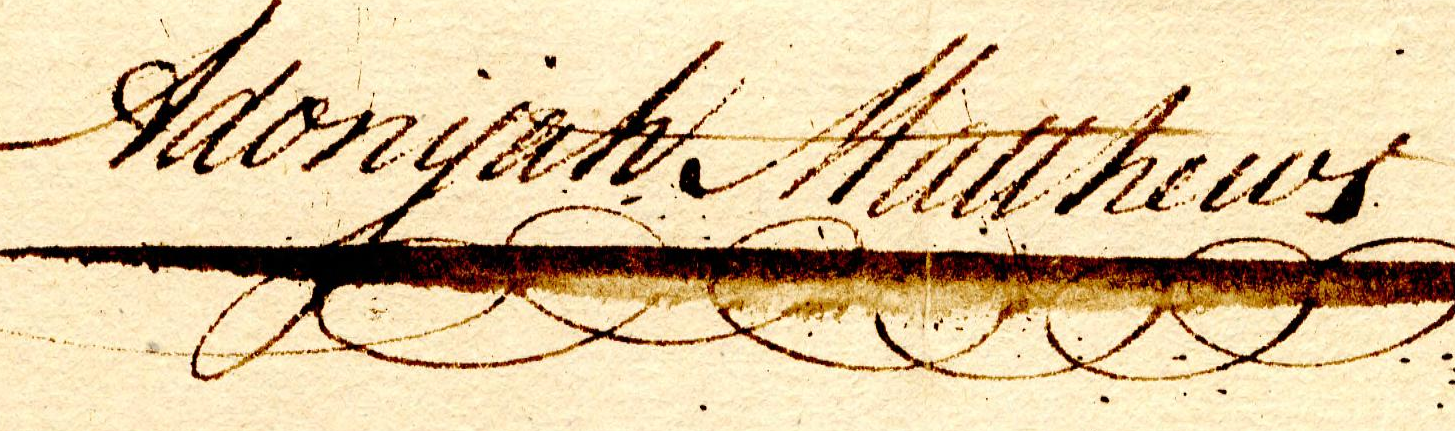Adonijah Matthews
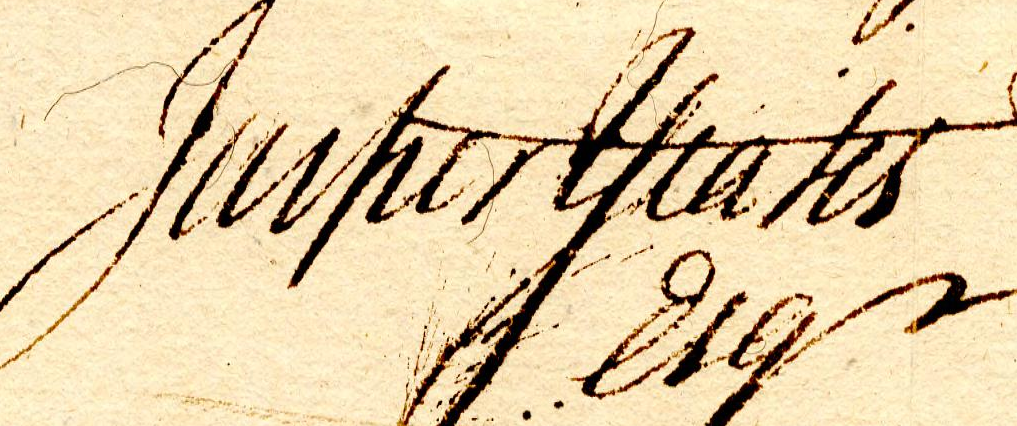Jasper Yeates
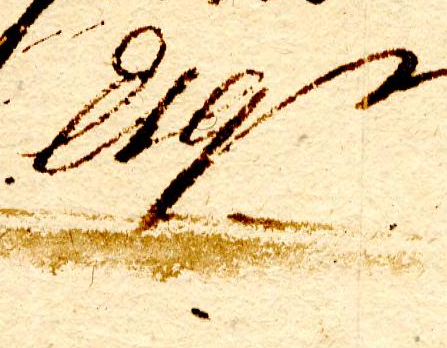Esq^r
